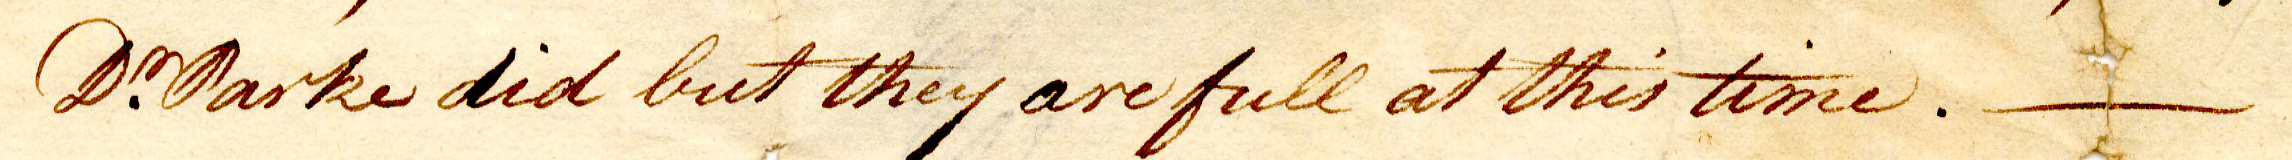D^r. Parke did but they are full at this time.-
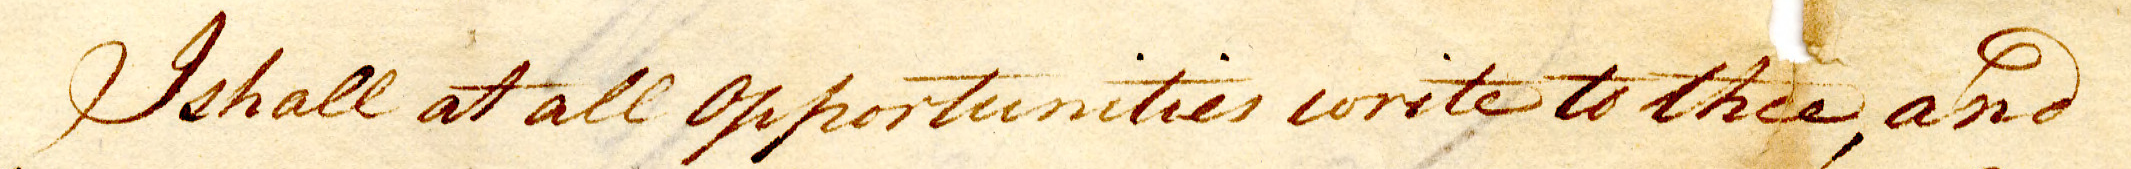I shall at all opportunities write to thee, and
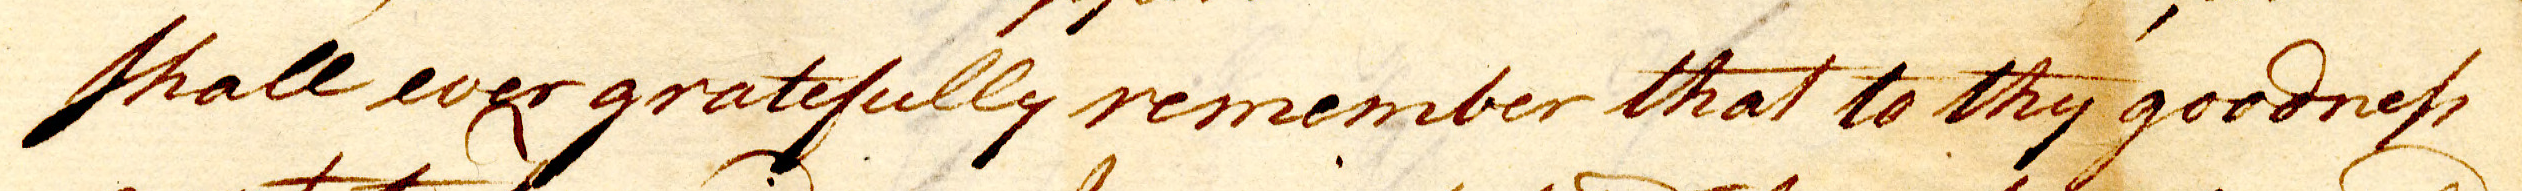shall ever gratefully remember that to thy goodness
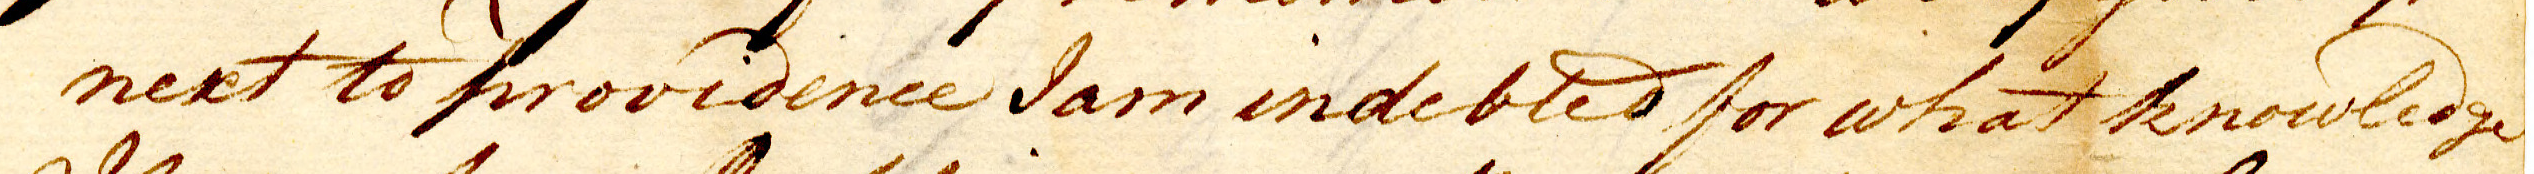next to providence I am indebted for what knowledge
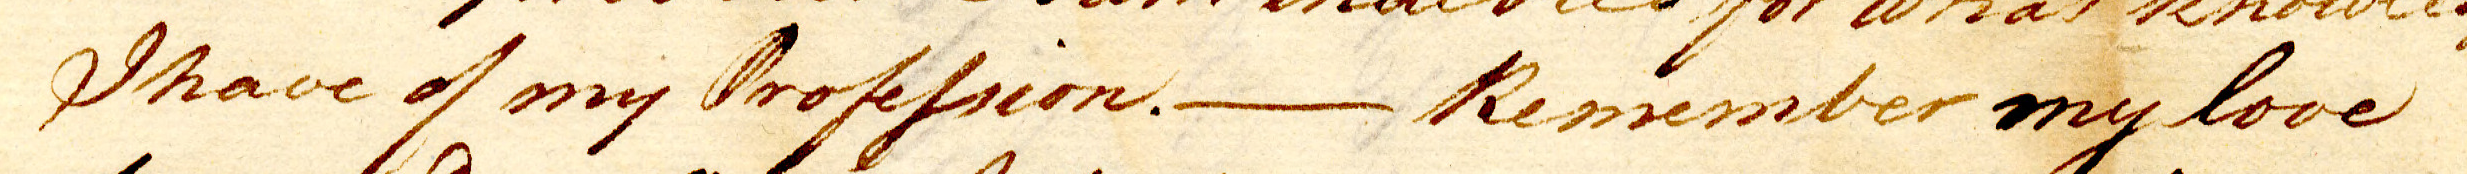I have of my Profession.- Remember my love
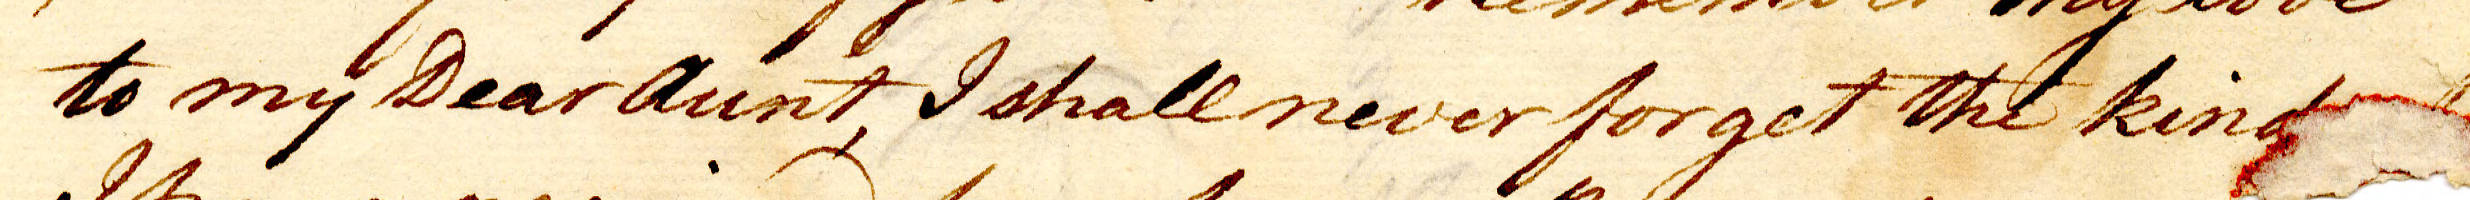to my Dear Aunt, I shall never forget the kind [__]
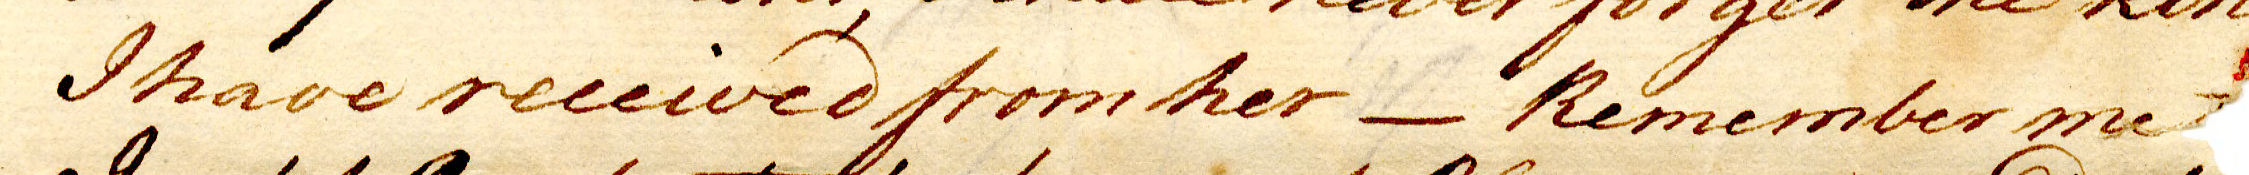I have received from her- Remember me
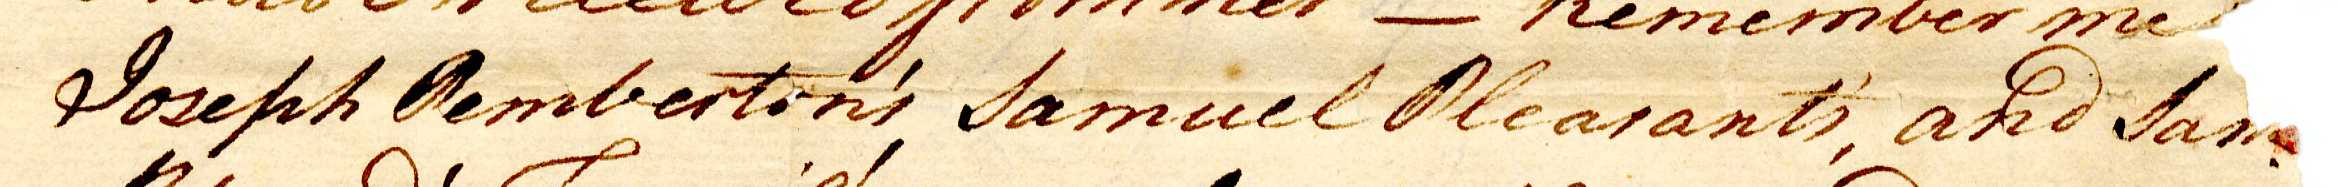Joseph Pemberton's, Samuel Pleasant's, and Sam.
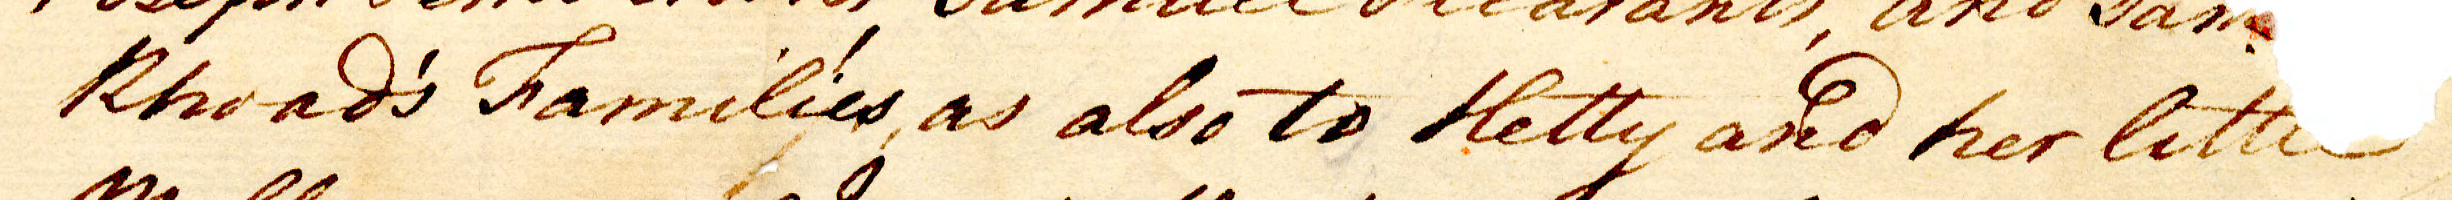Rhoad's Families as also to Hetty and her little
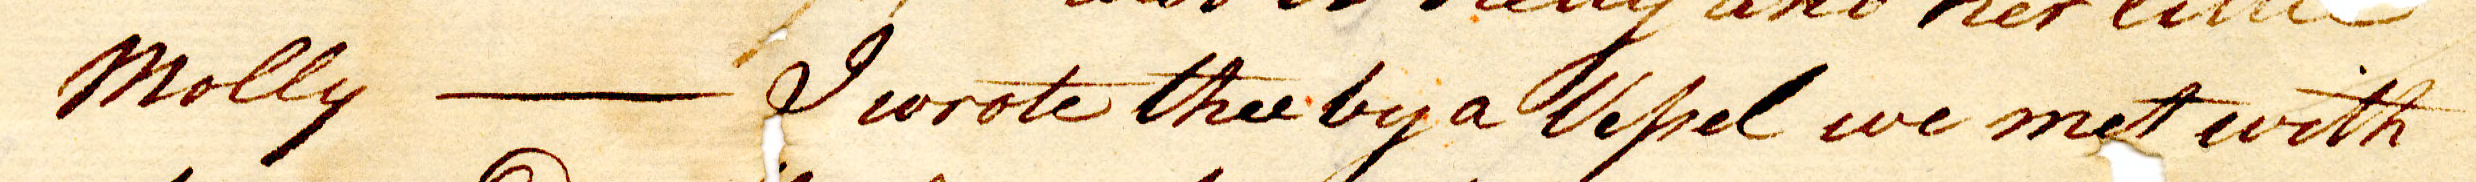Molly- I wrote thee by a Vessel we met with
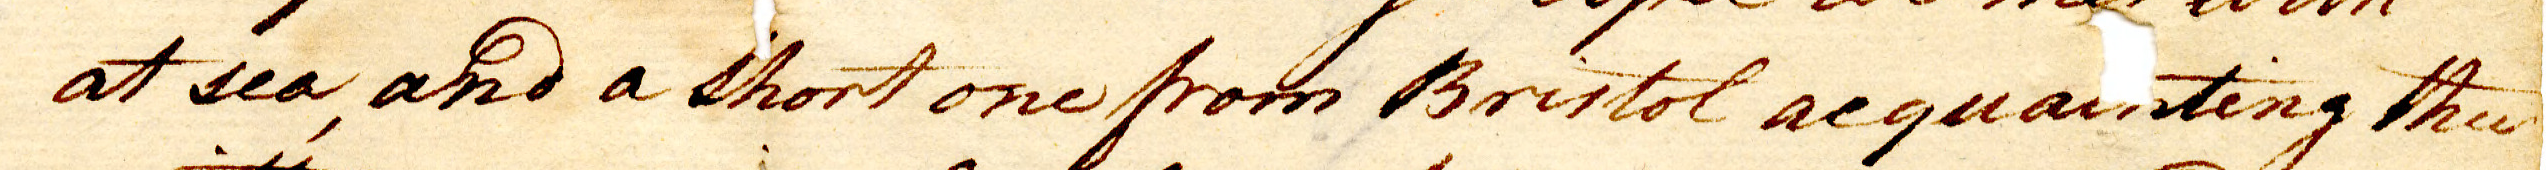at sea, and a short one from Bristol acquainting thee
